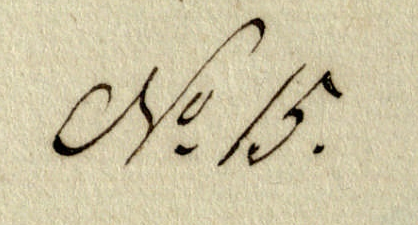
No 15.
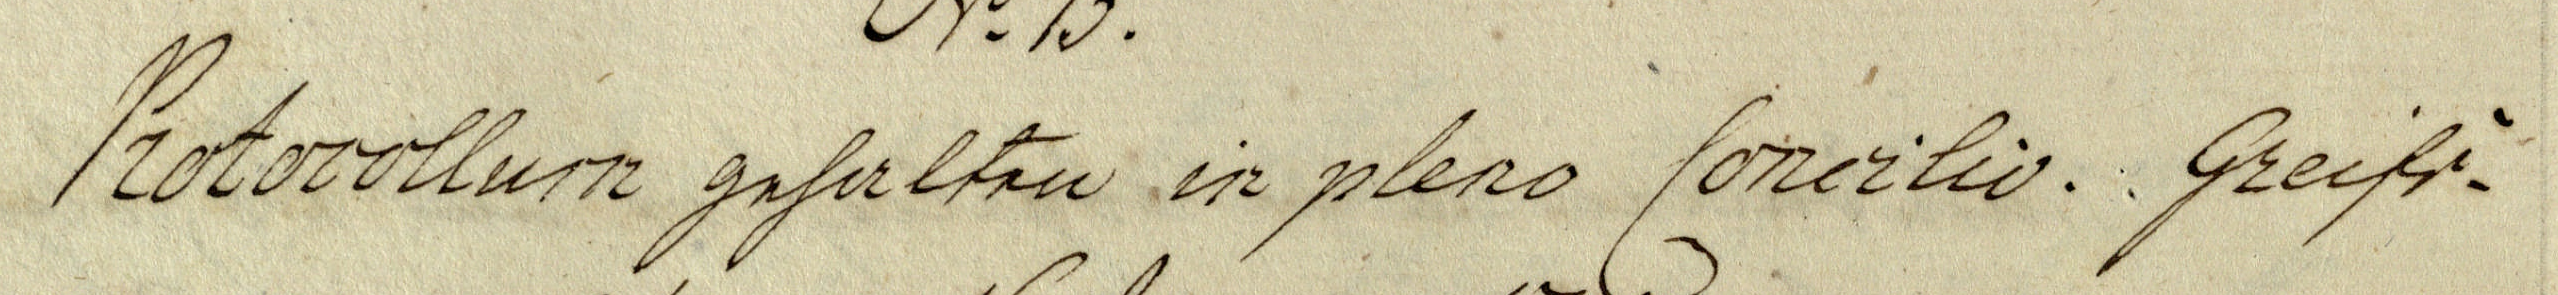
Protocollum gehalten in pleno Concilio. Greifs¬
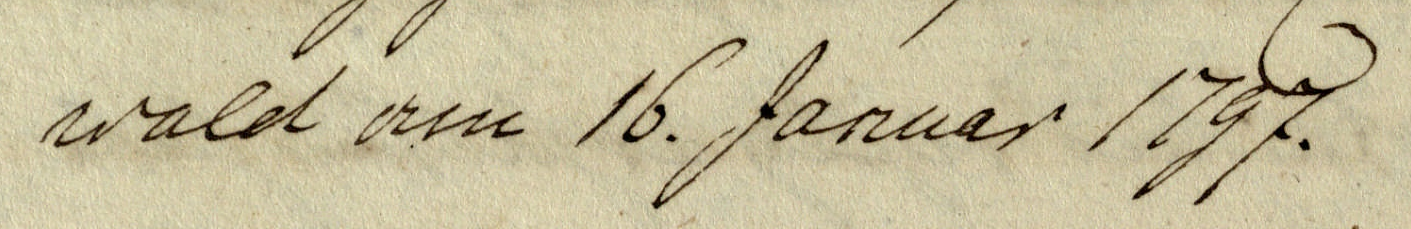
wald am 16. Januar 1797.
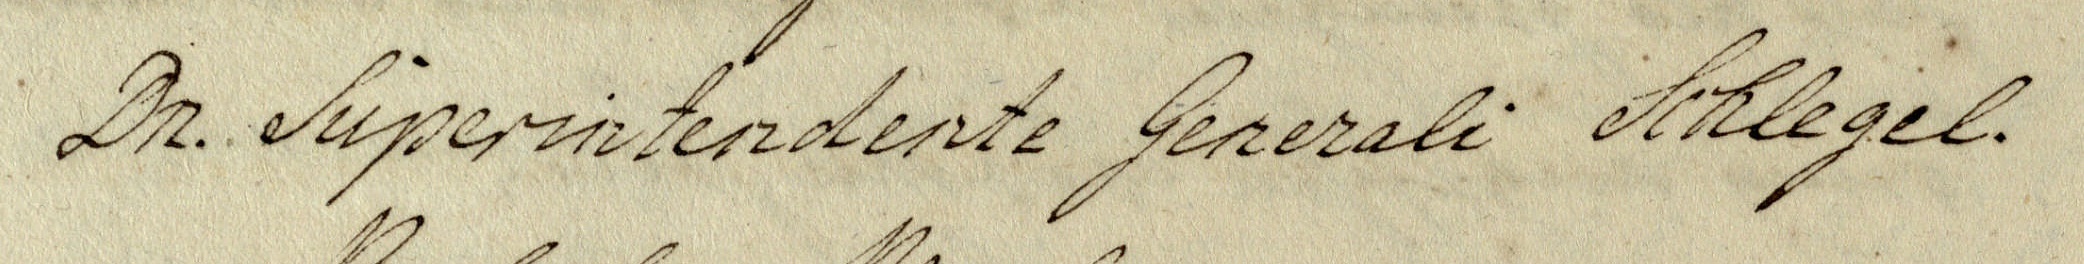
Dn. Superintendente Generali Schlegel.
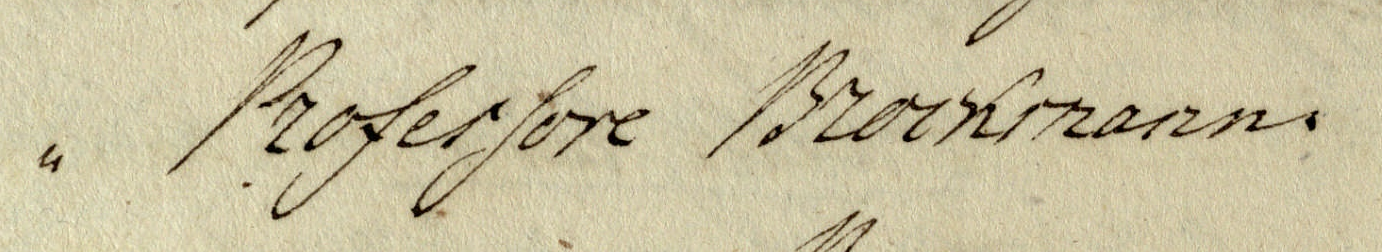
Professore Brockmann.
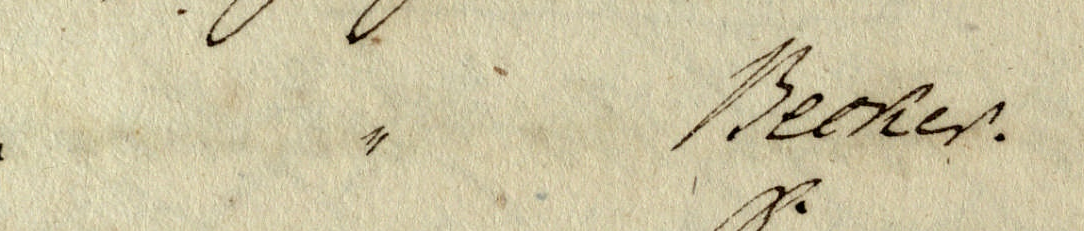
Becker.
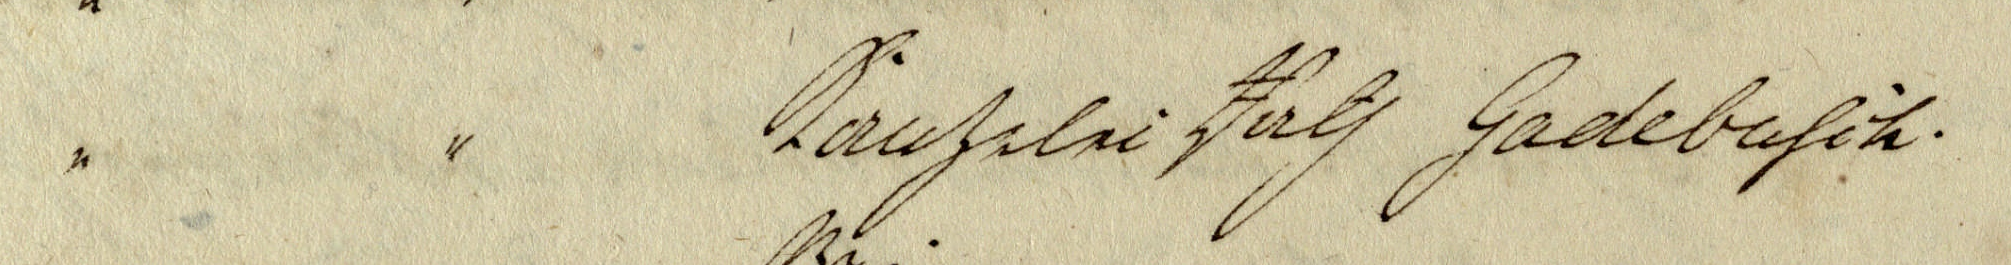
Kanzelei Rath Gadebusch.
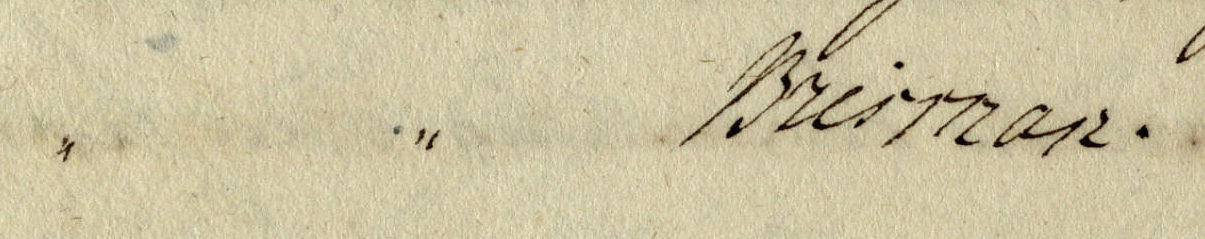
Brisman.
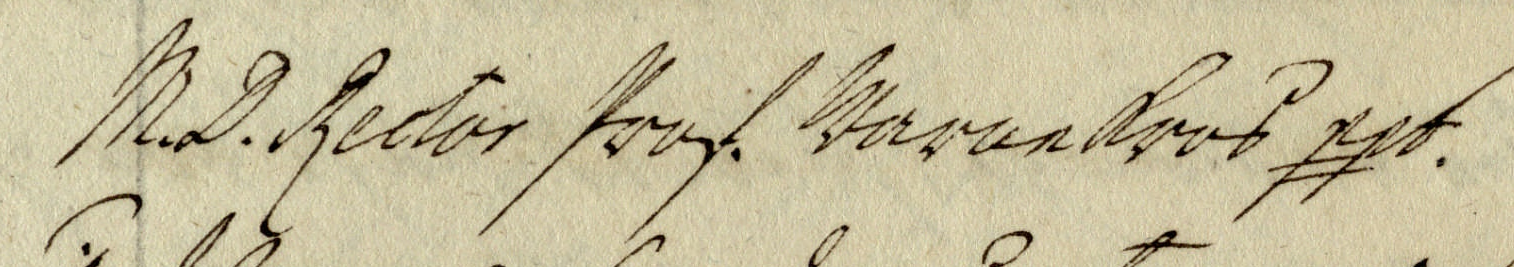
M. D Rector Prof. Warnekros ppt.
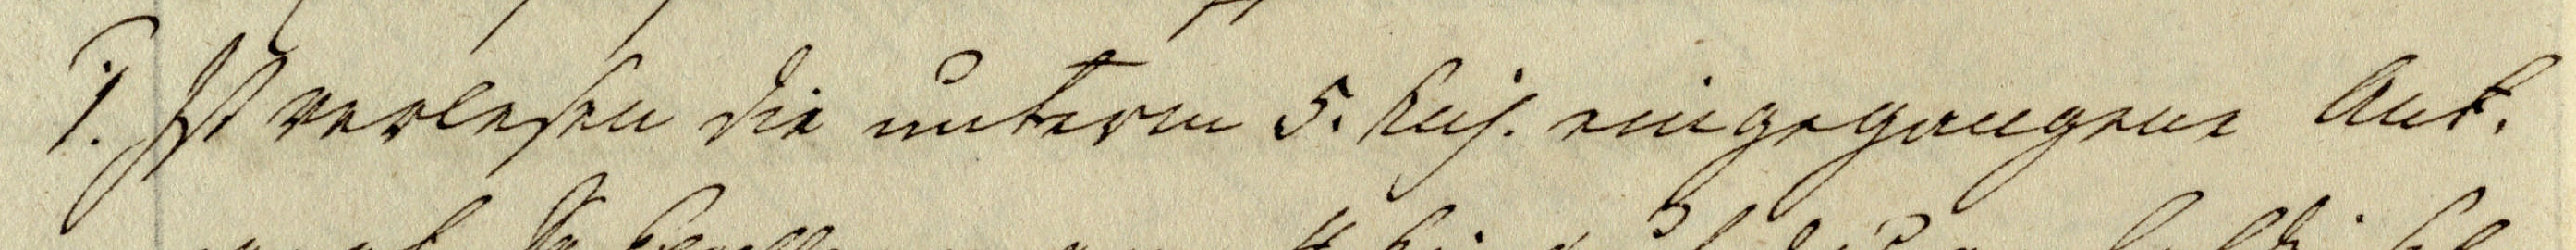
1. Ist verlesen die unterm 5. huj. eingegangene Ant¬
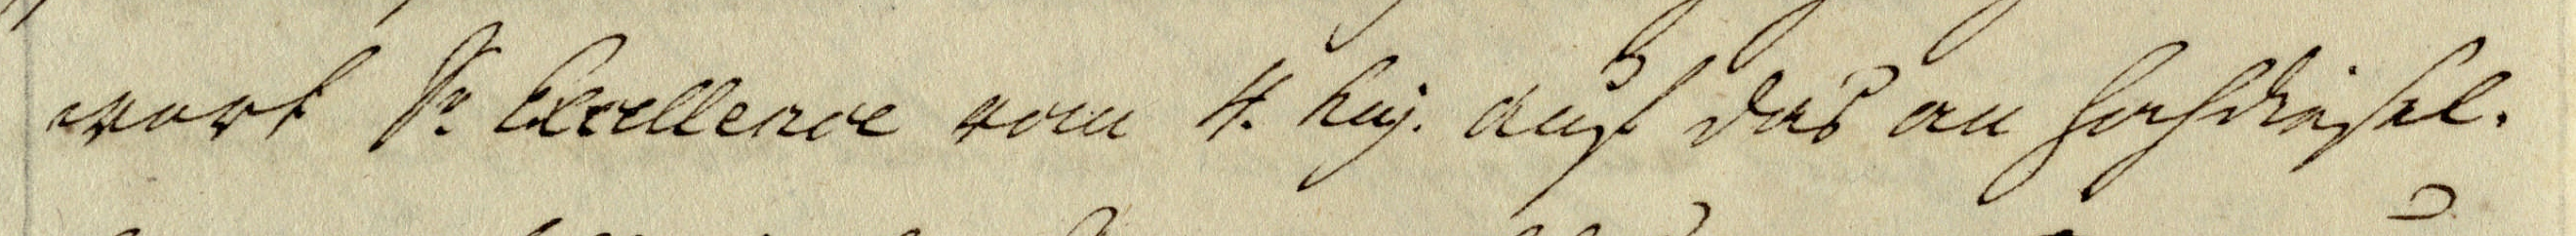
wort Sr Excellence vom 4. huj. auf das an hochiesel¬
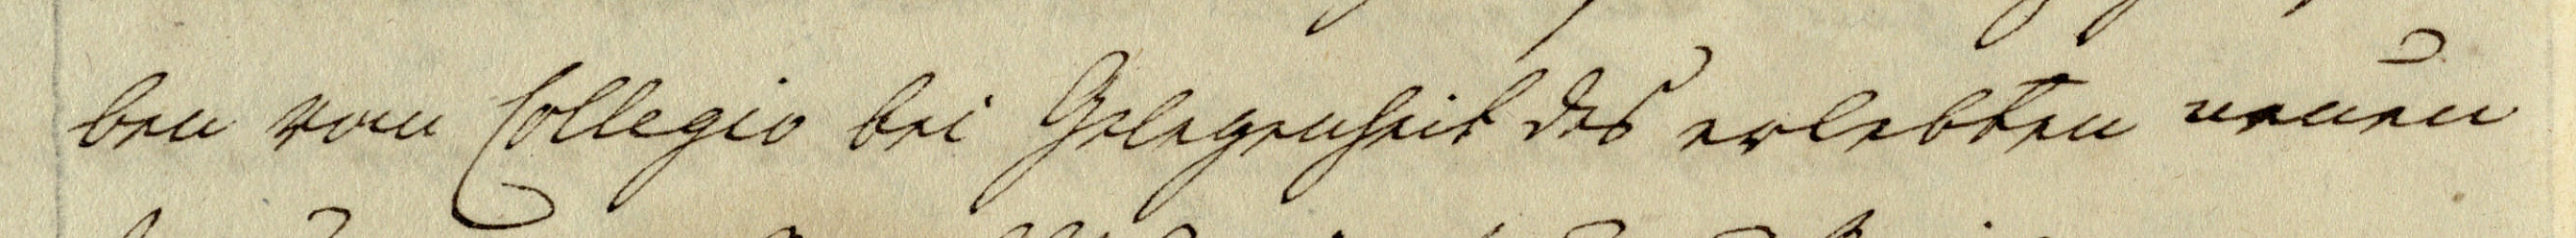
ben vom Collegio bei Gelegenheit des erlebten neuen
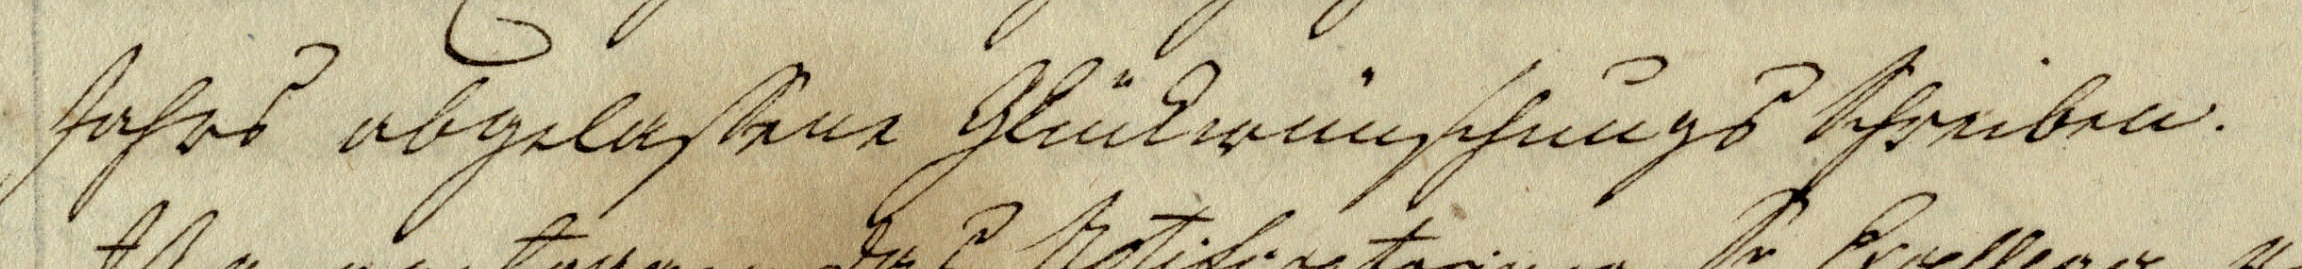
Jahrs abgelassene Glückwünschungs Schreiben.
